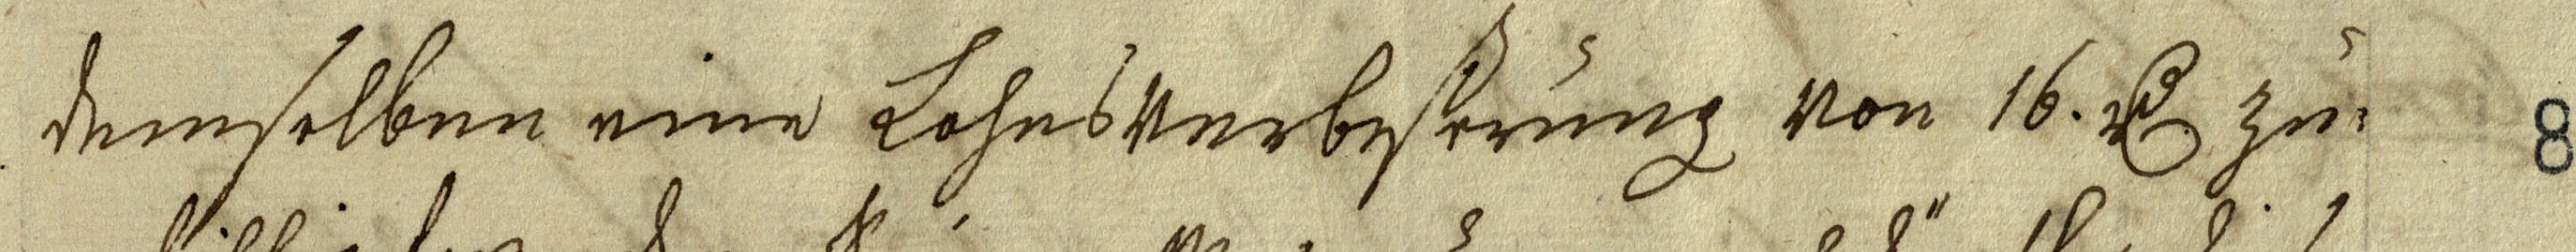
demselben eine Lohnsverbeßerung von 16 r. zu¬
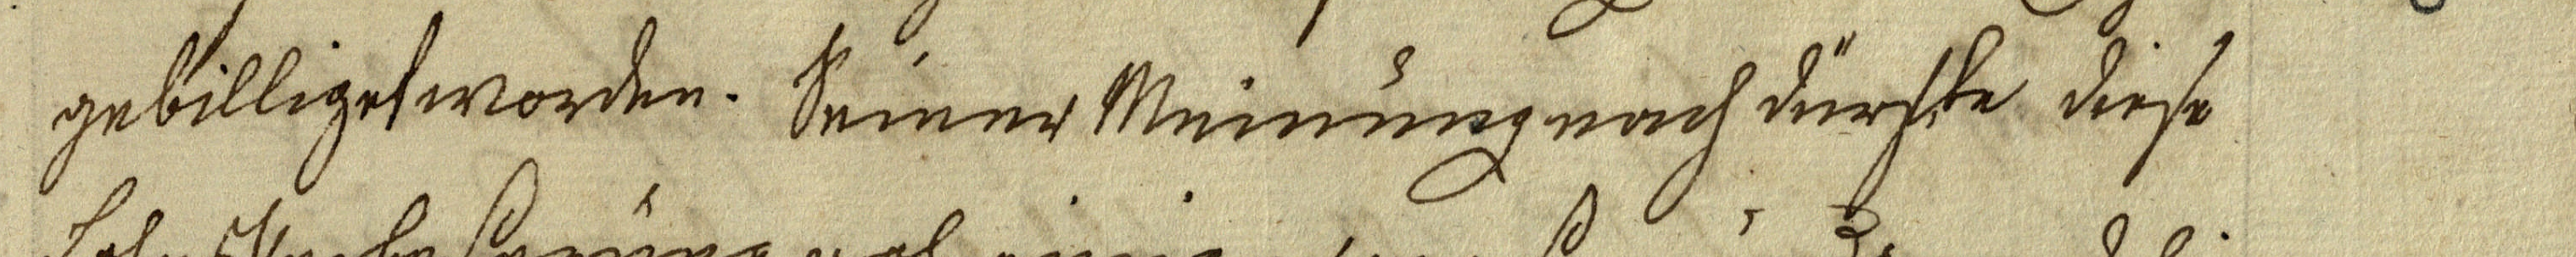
gebilligt worden. Seiner Meinung nach dürfte diese
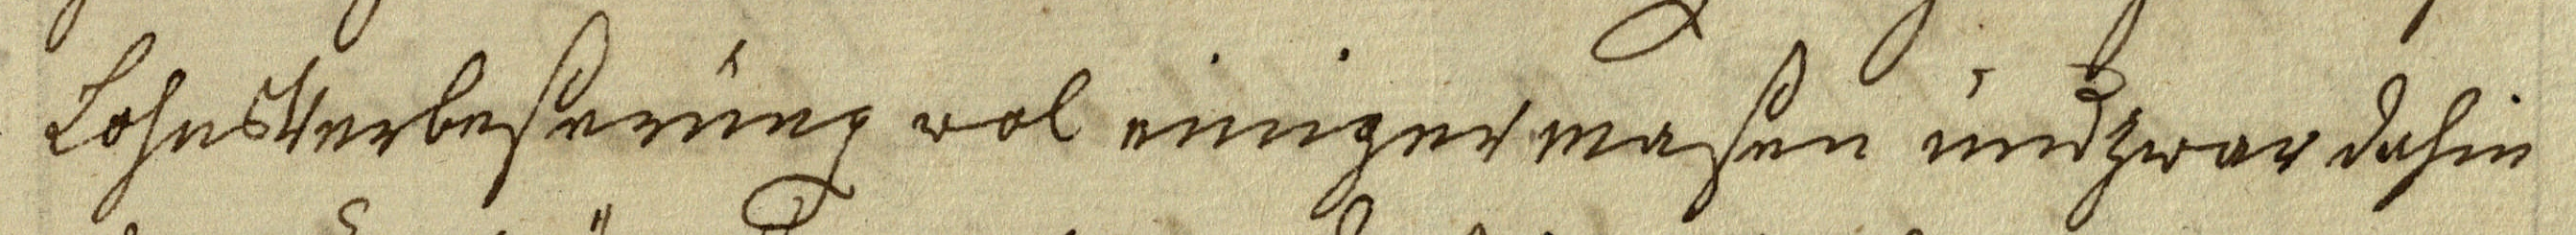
Lohnsverbeßerung wol einiger maßen und zwar dahin
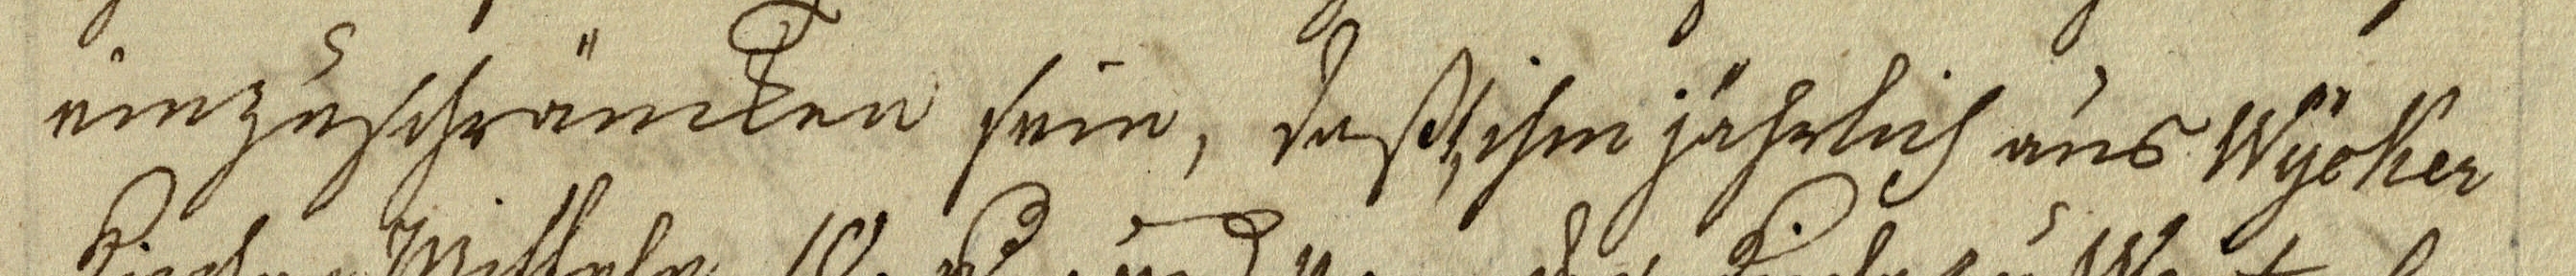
einzuschränken sein, daß 1, ihm jährlich aus Wÿcker
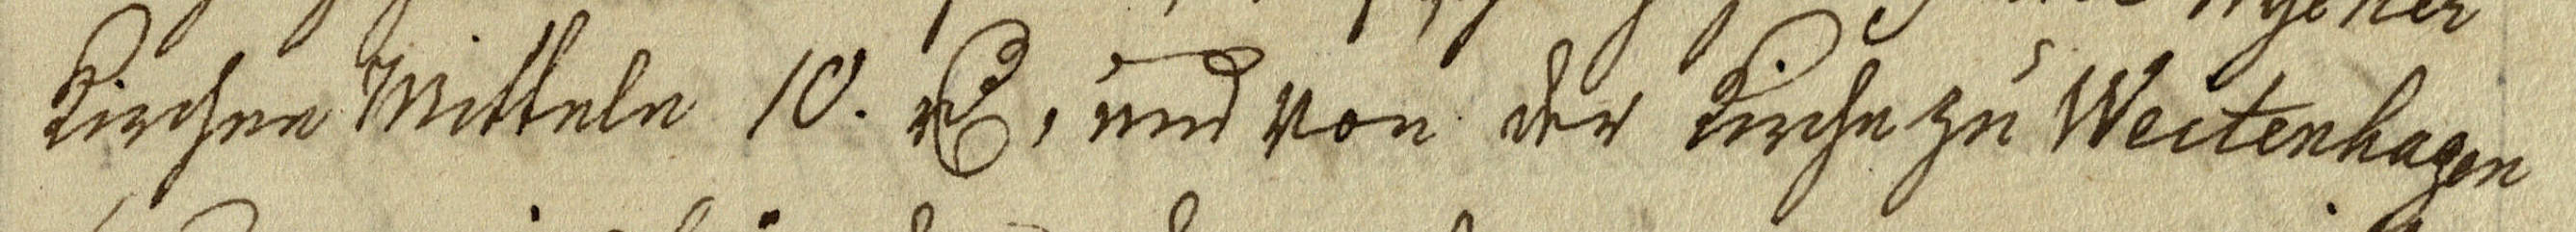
Kirchen Mitteln 10. r, und von der Kirche zu Weitenhagen
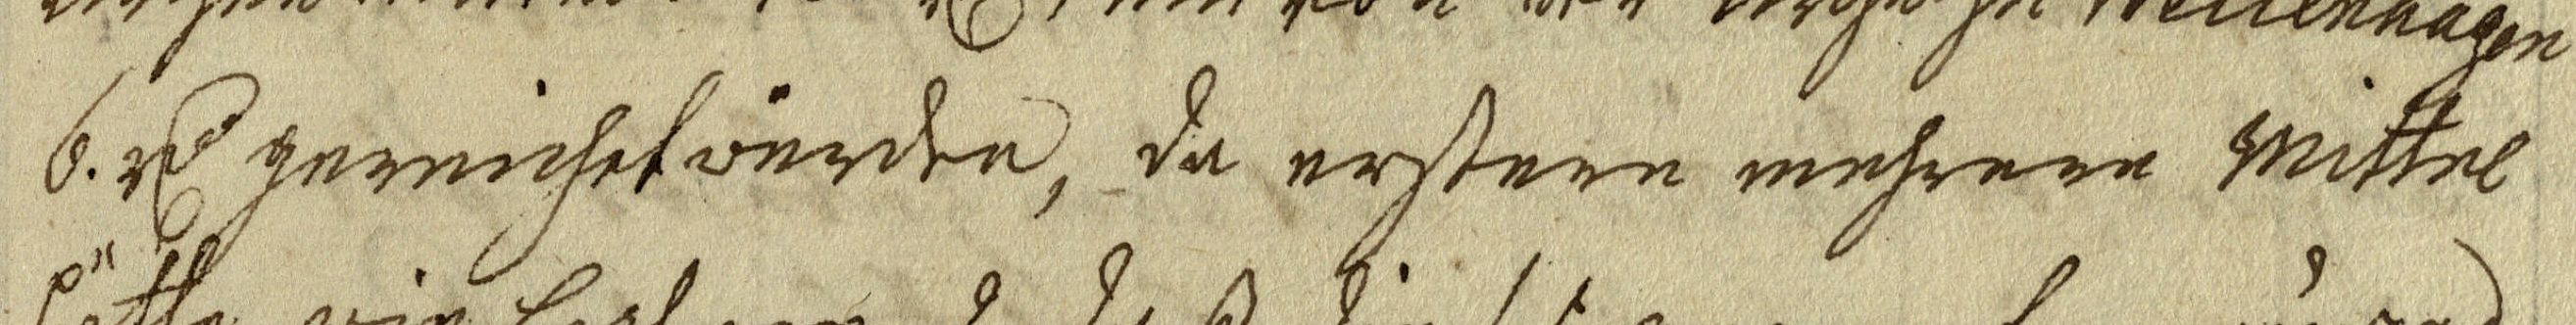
6. r gereichet würden, da erstere mehrere Mittel
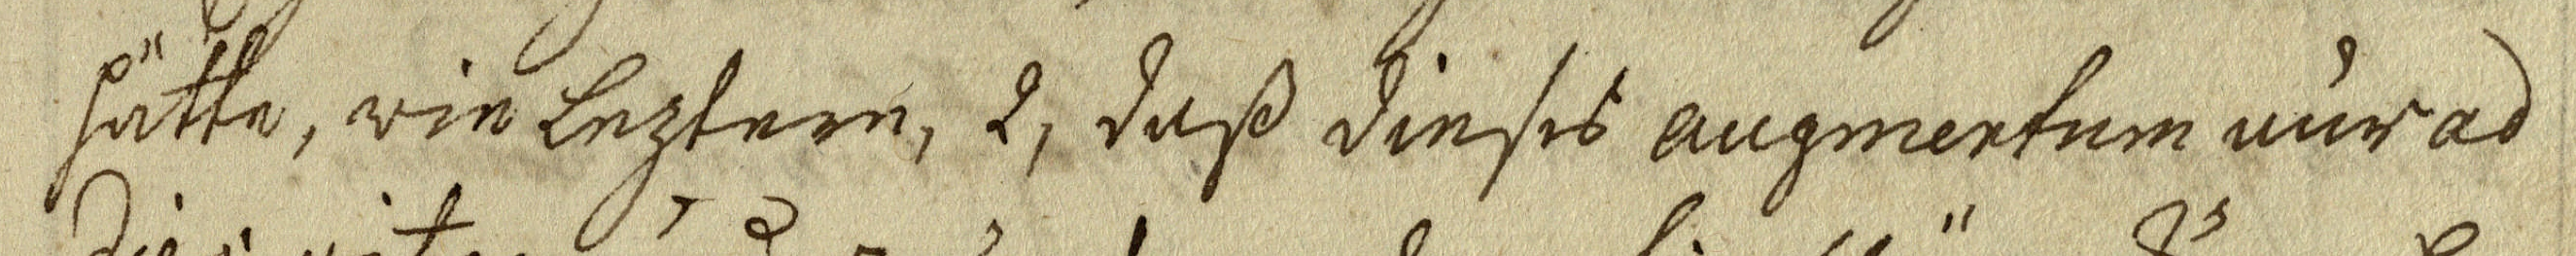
hätte, wie leztere, 2, daß dieses augmertum nur ad
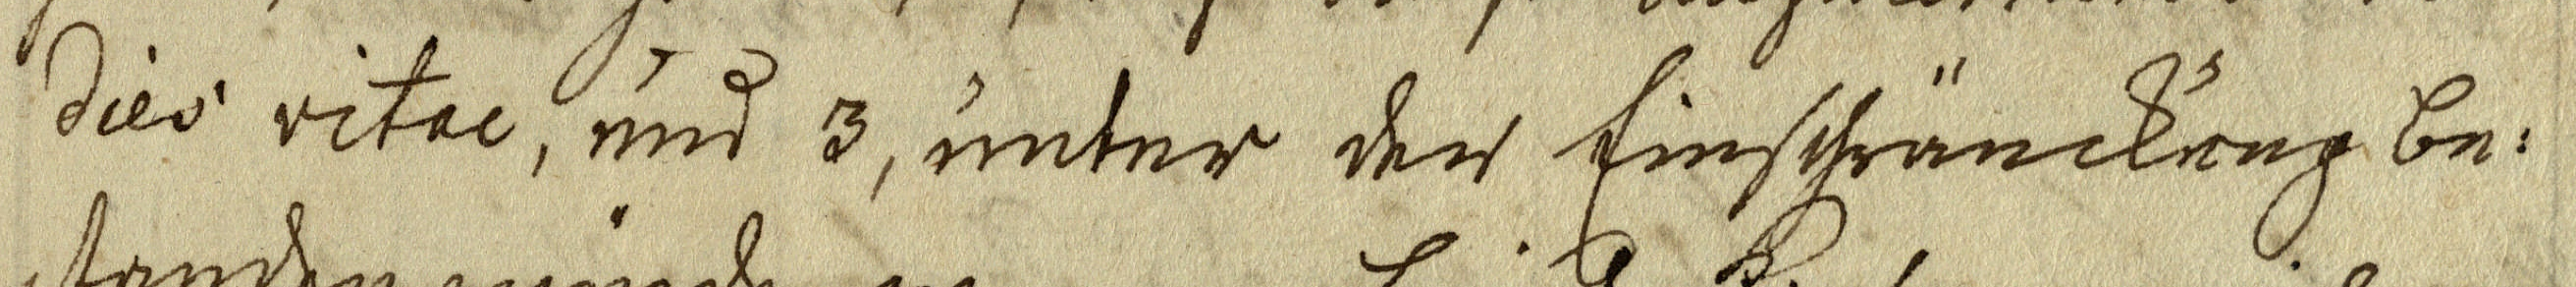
dies vitae, und 3, unter der Einschränckung be¬
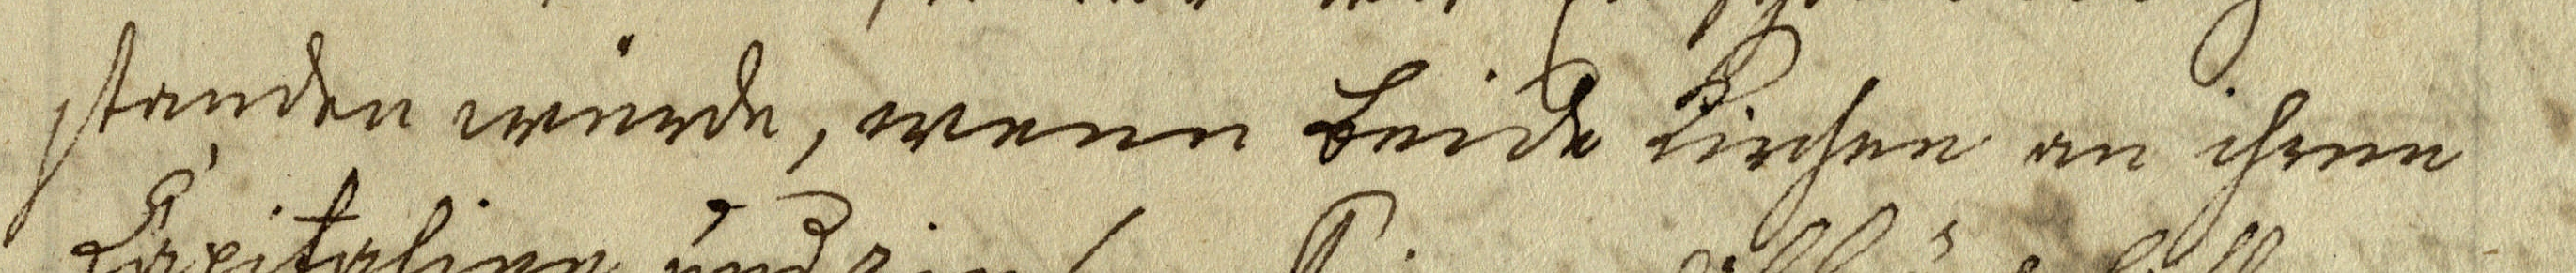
standen würde, wenn beide Kirchen an ihren
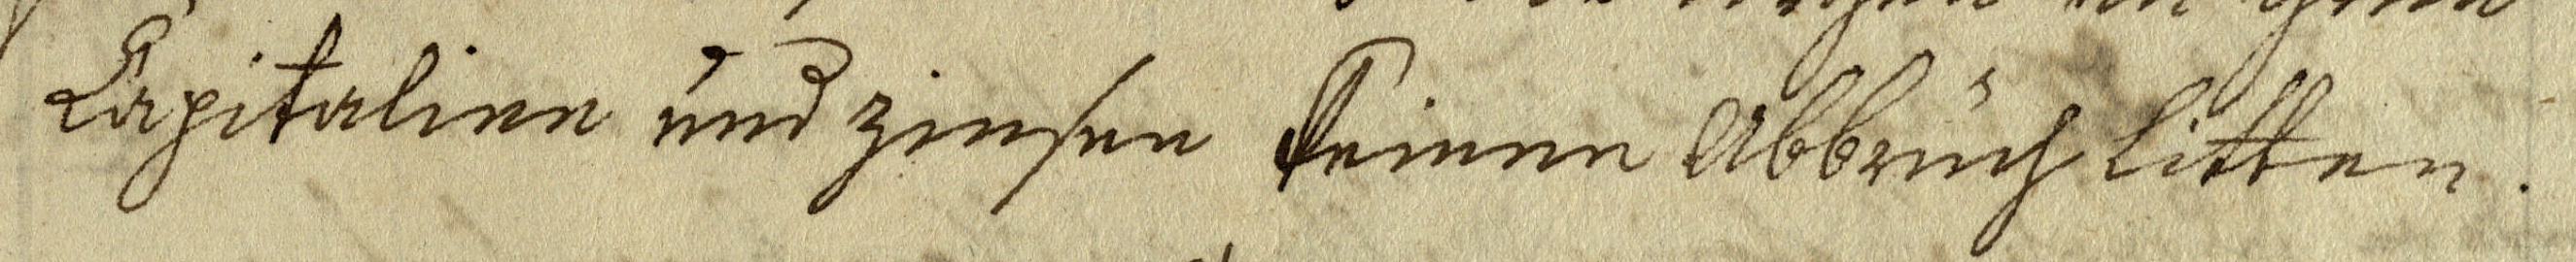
Capitalien und Zinsen keinen Abbruch litten.
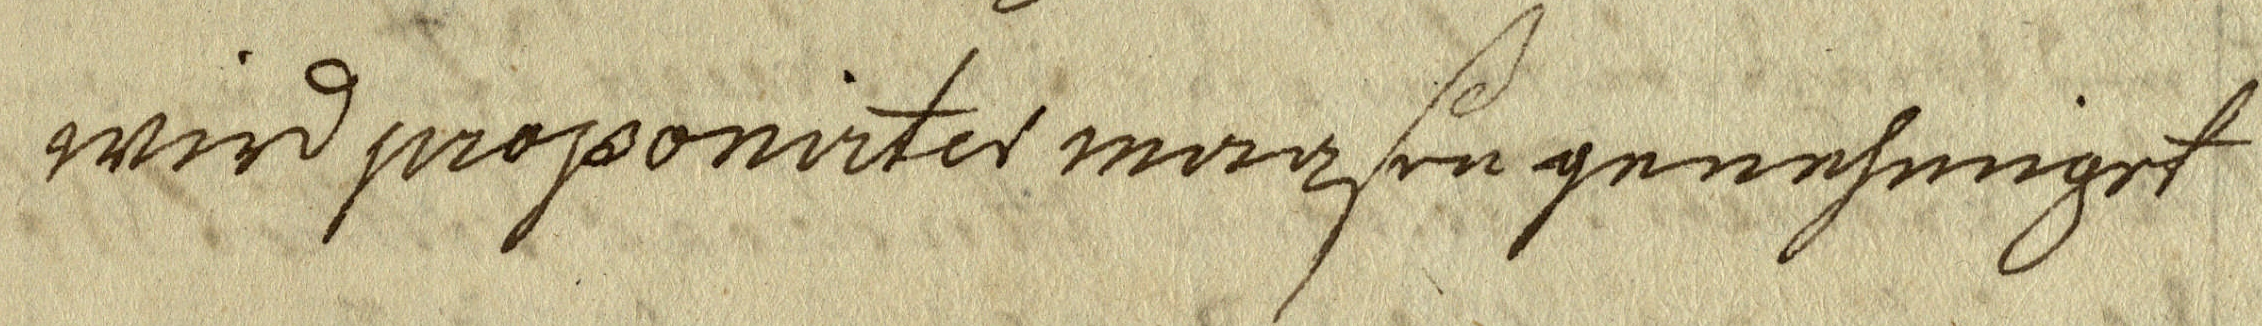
wird proponirter maaßen genehmiget
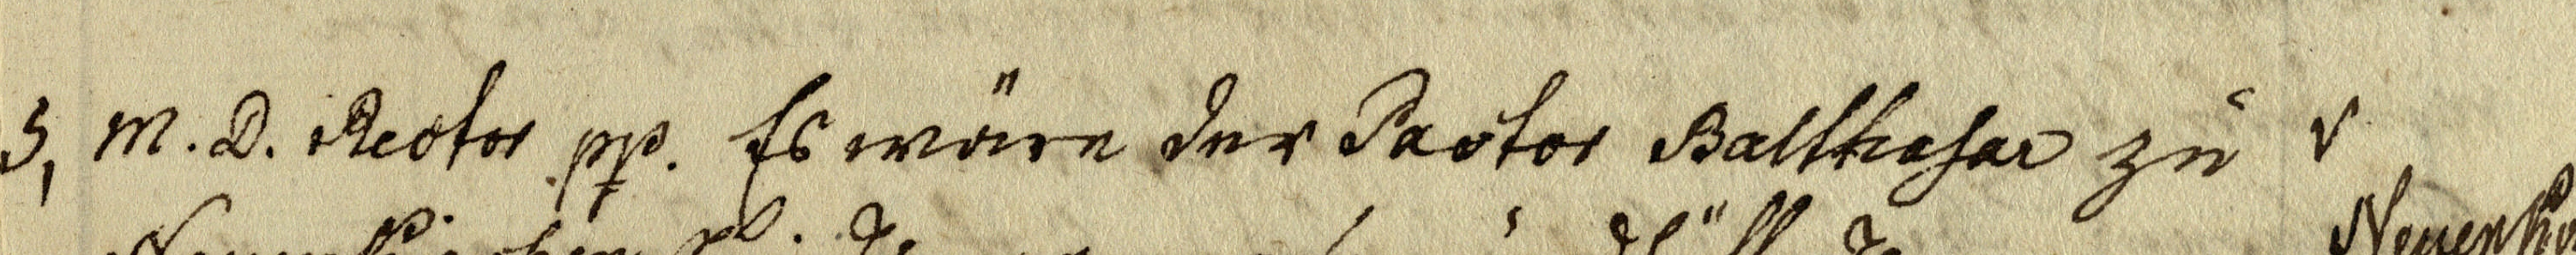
5. M. D. Rector pp. Es wäre der Pastor Balthasar zu
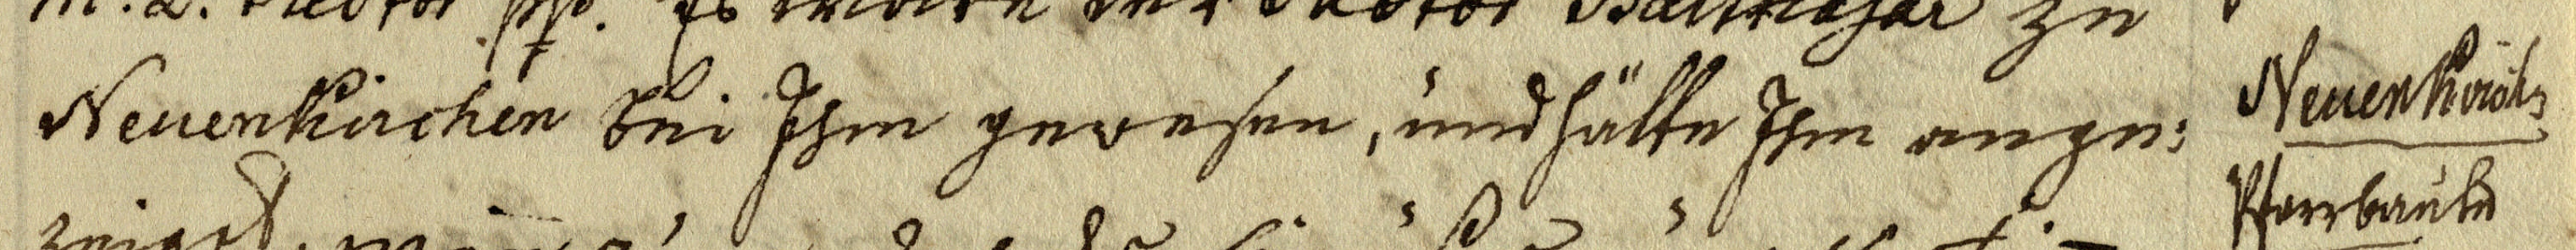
Neuenkirchen bei ihm gewesen, und hätte ihm ange- Neuenkirchen
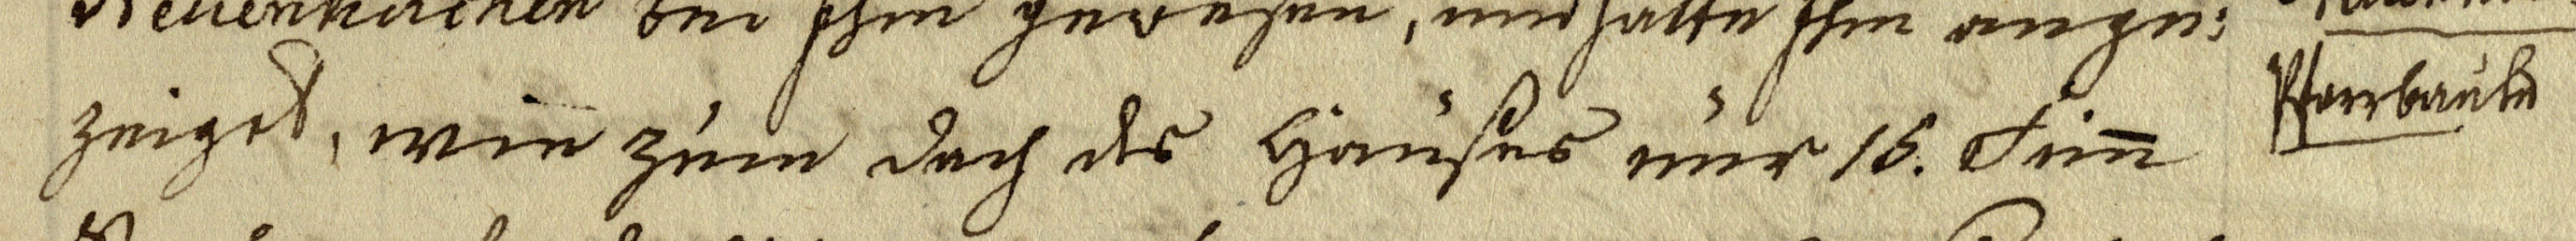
zeiget, wie zum Dach des Hauses nur 16. Fim Pfarrbaute
